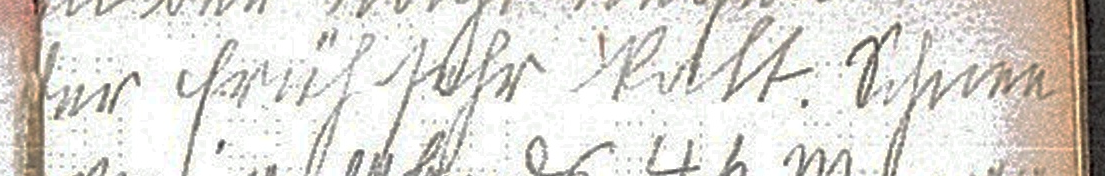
der Früh sehr kalt. Schnee
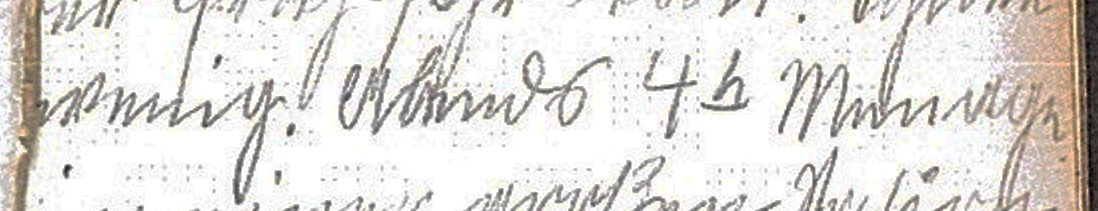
wenig. Abends 4h Menage
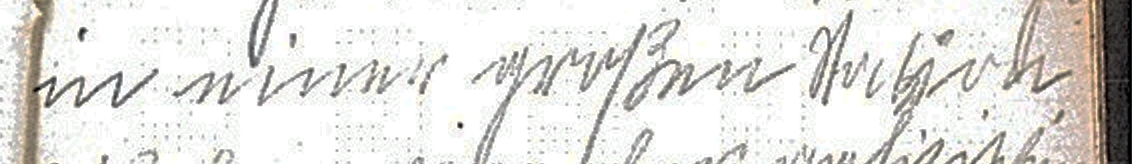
in einer großen Station
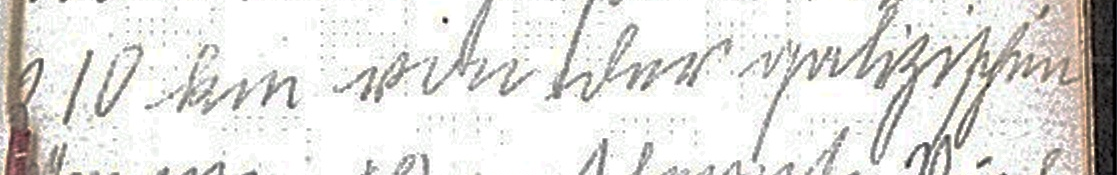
210 km von der galizischen
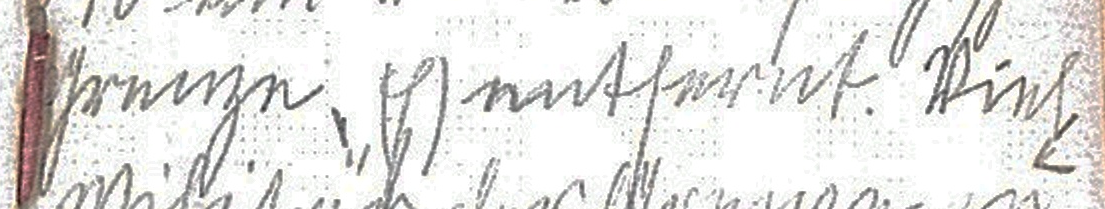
Grenze entfernt. Viel
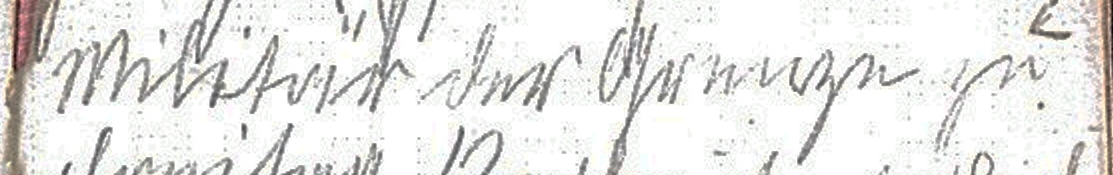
Militär der Grenze zu.
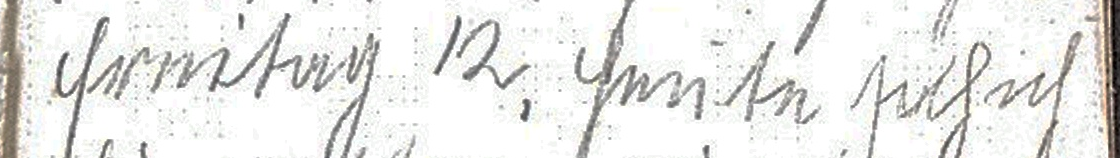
Freitag 12 . Heute sah ich
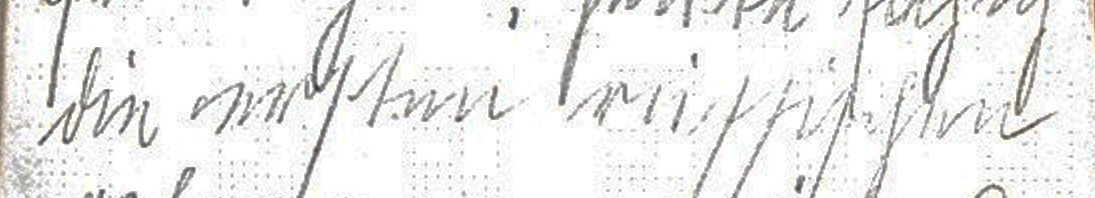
die ersten russischen
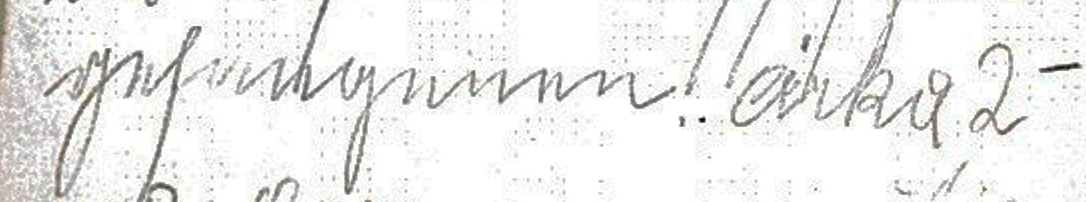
Gefangenen cirka 2-
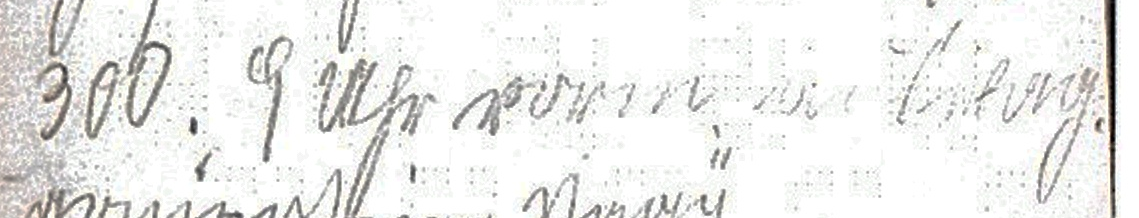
300. 9 Uhr vorm einwag-
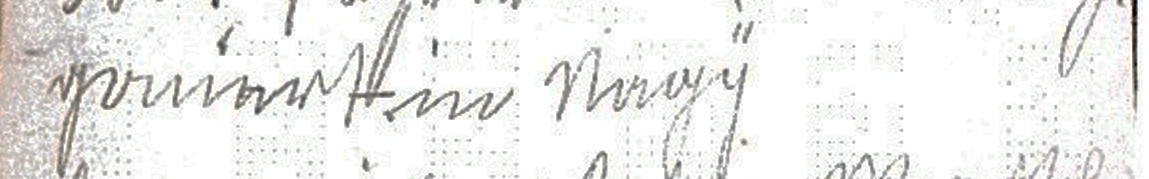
goniert in Nagy.
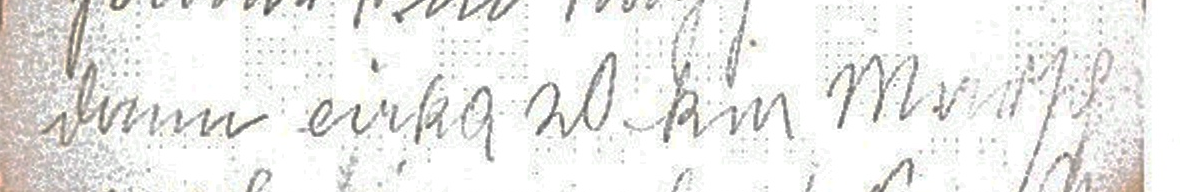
dann cirka 20 km Marsch
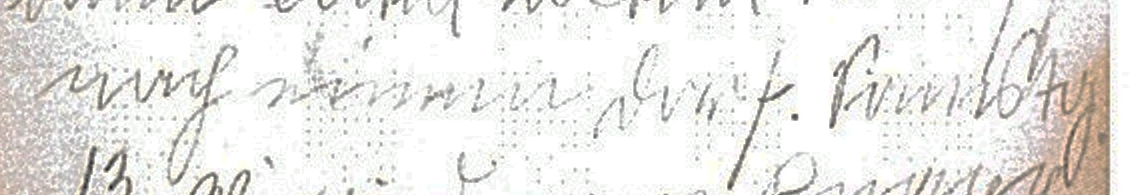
durch ein Dorf. Samstag
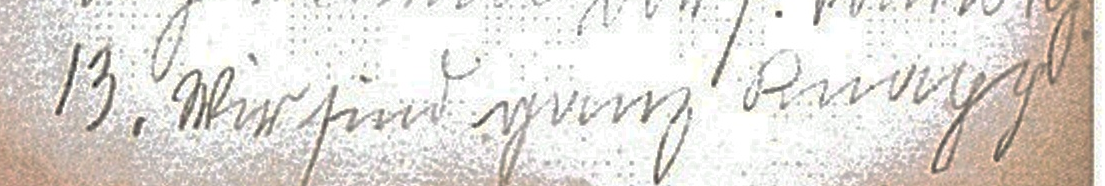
13. Wir sind ganz Knapp
